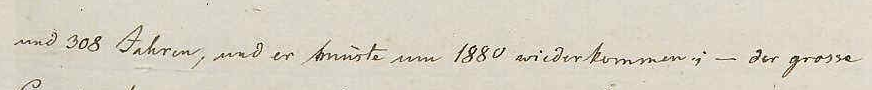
und 308 Jahren, und er müste um 1880 wiederkommen; – der grosse
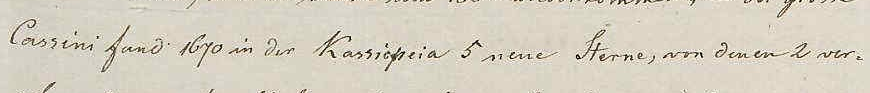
Cassini fand 1670 in der Kassiopeia 5 neue Sterne, von denen 2 ver-
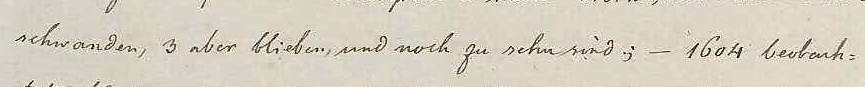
schwanden, 3 aber blieben und noch zu sehn sind; – 1604 beobach-
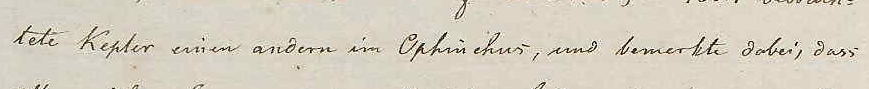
tete Kepler einen andern im Ophiuchus, und bemerkte dabei, dass
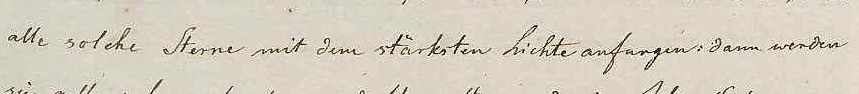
alle solche Sterne mit dem stärksten Lichte anfangen: dann werden
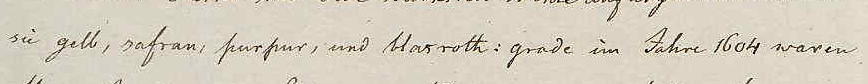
sie gelb, safran, purpur, und blasroth: grade im Jahre 1604 waren
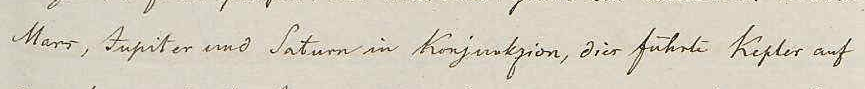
Mars, Jupiter und Saturn in Konjunkzion, dies führte Kepler auf
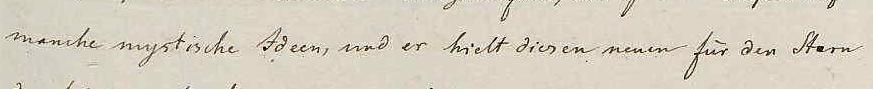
manche mystische Ideen, und er hielt diesen neuen für den Stern
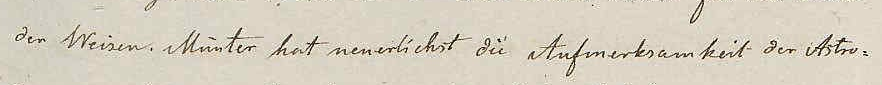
der Weisen. Münter hat neuerlichst die Aufmerksamkeit der Astro-
